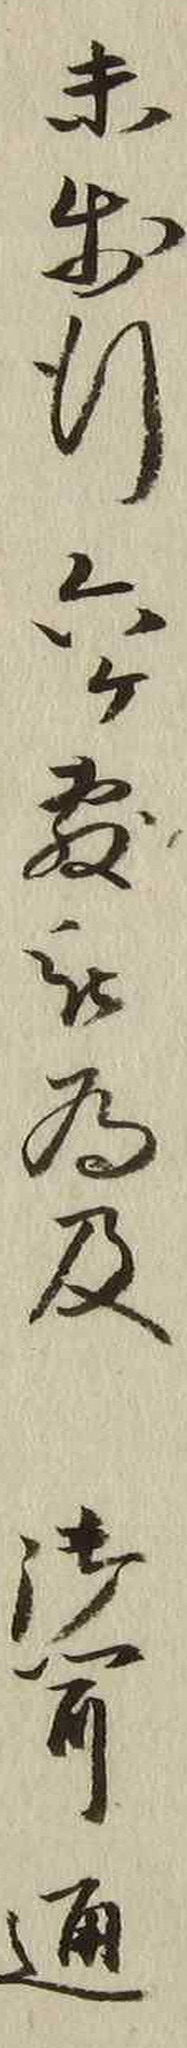未歩行六ヶ敷被為及御聞通
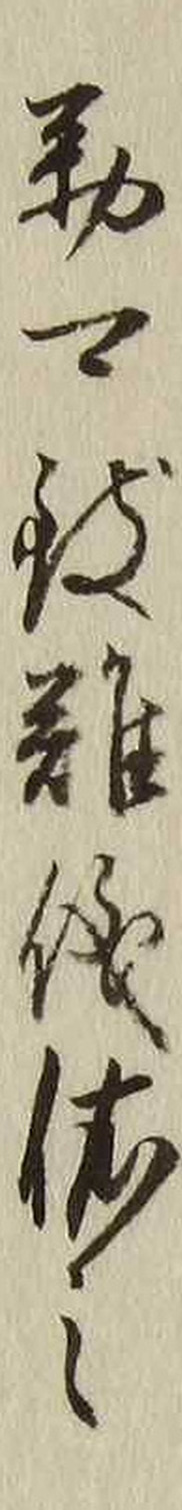勤可致難儀依之
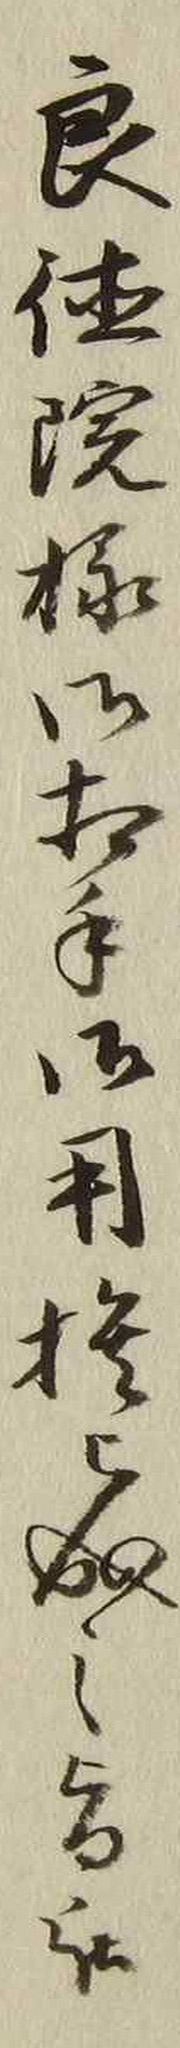良徳院様御相手御用権被成之旨被
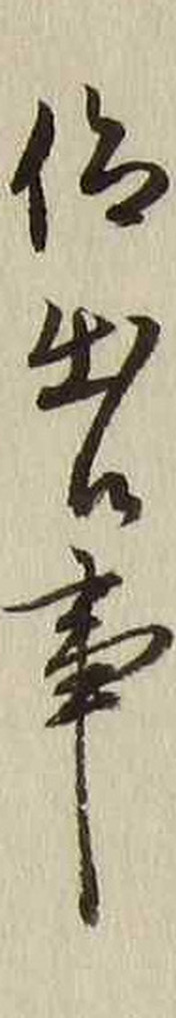仰付候事
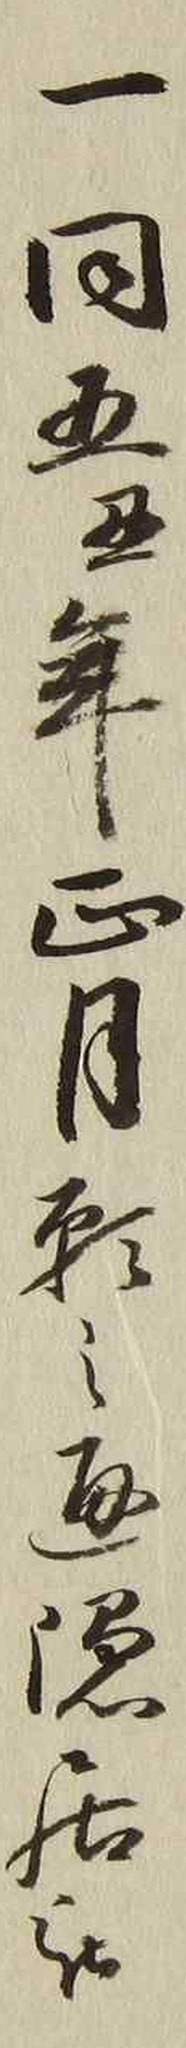一同五丑年正月願之通隠居被
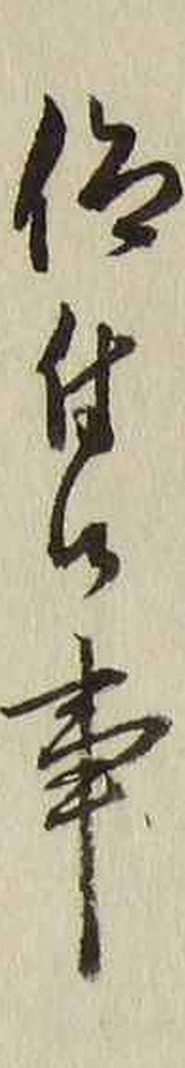仰付候事
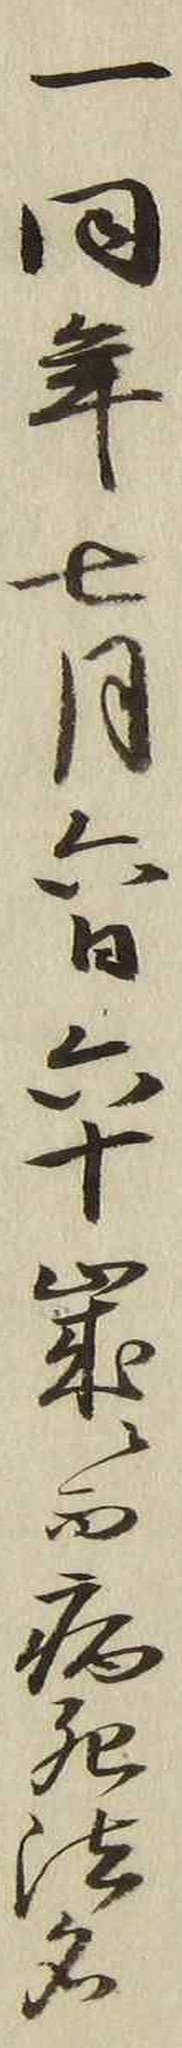一同年七月六日六十歳ニ而病死法名
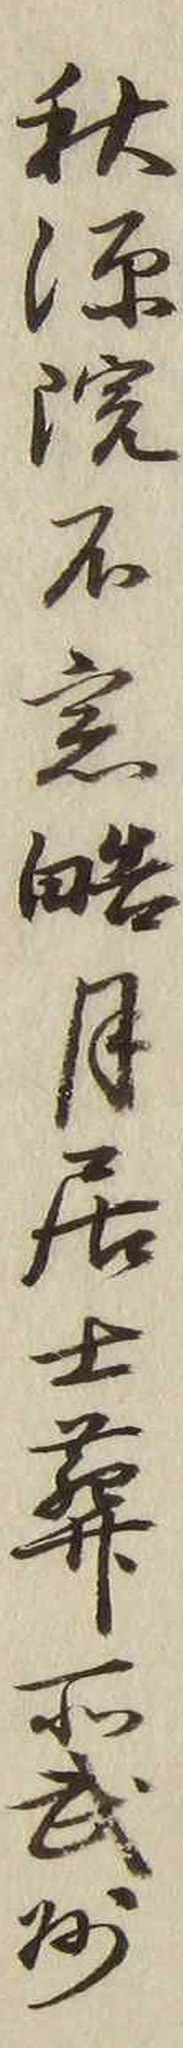秋源院不意皓月居士葬所武州

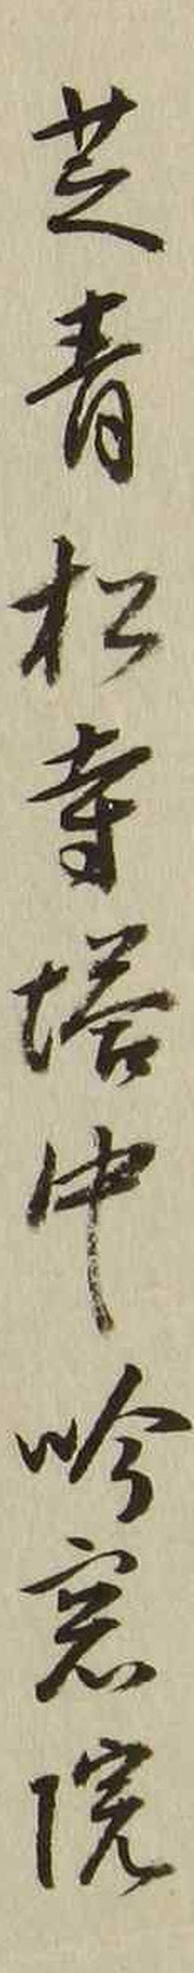芝青松寺塔中吟窓院
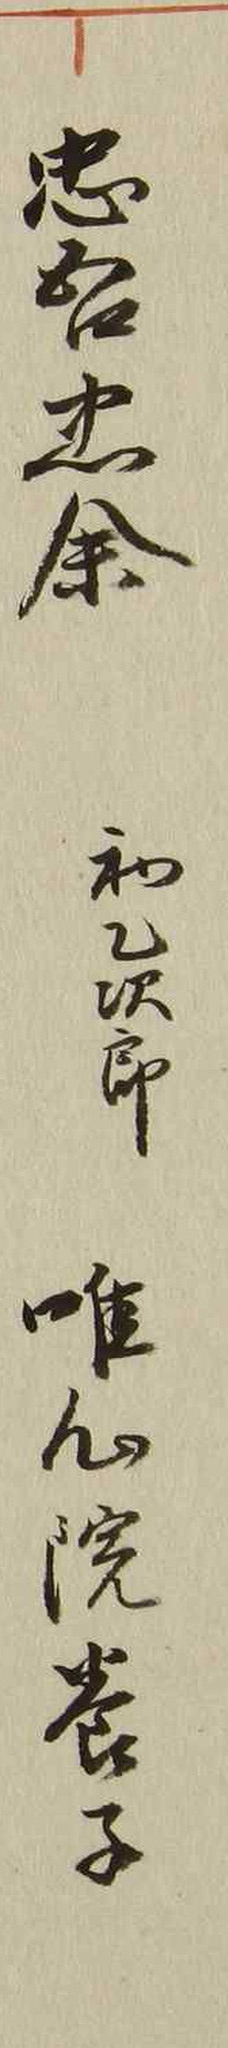忠吾忠余初乙次郎唯心院養子
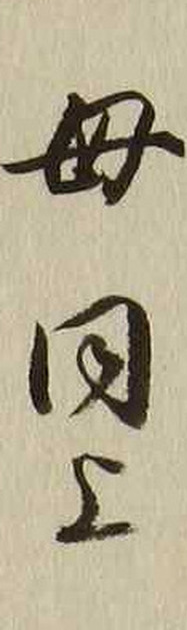母同上
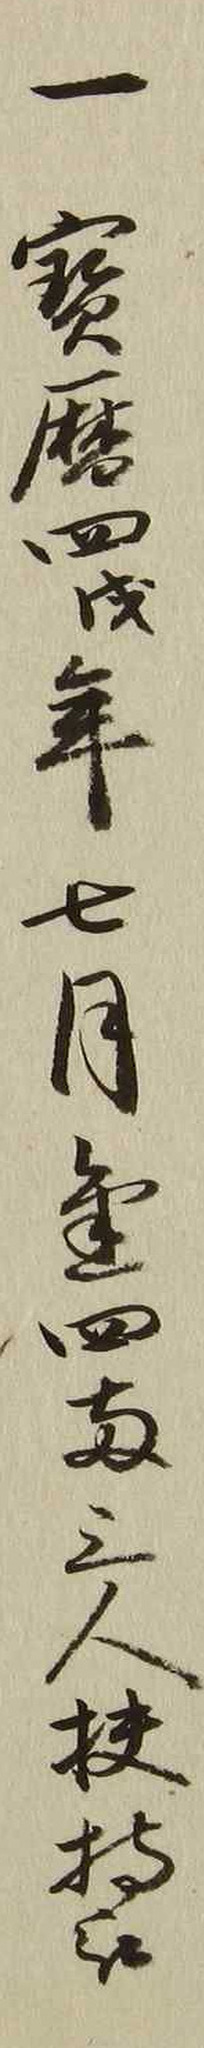一宝暦四戌年七月金四両三人扶持被
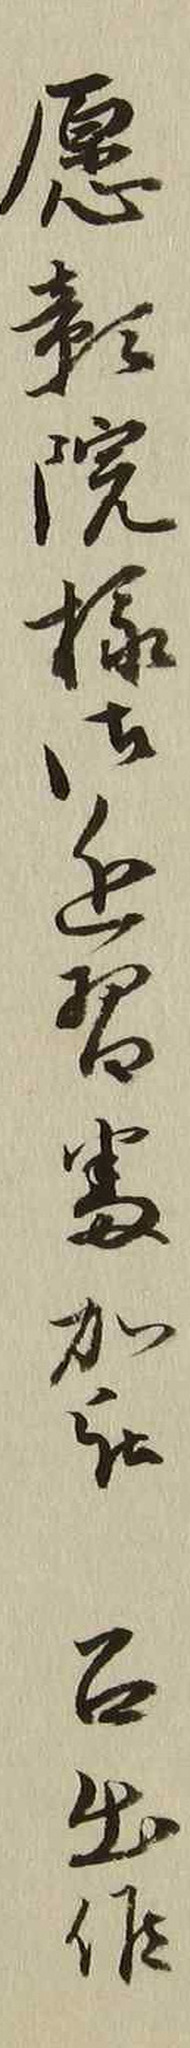愿彰院様御近習番加被召出候
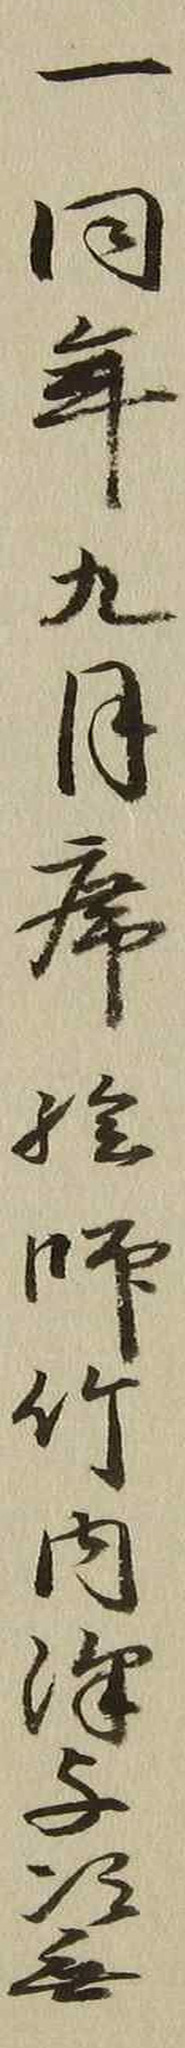一同年九月席絵師竹内沢与次無
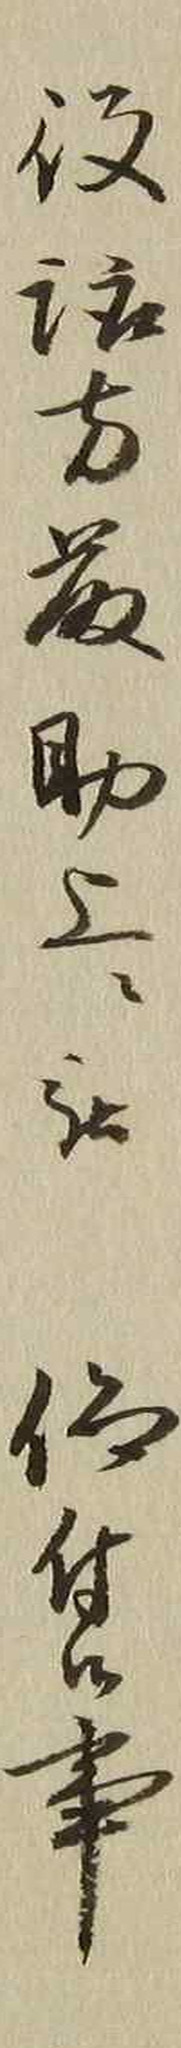役諏方藤助上ニ被仰付候事
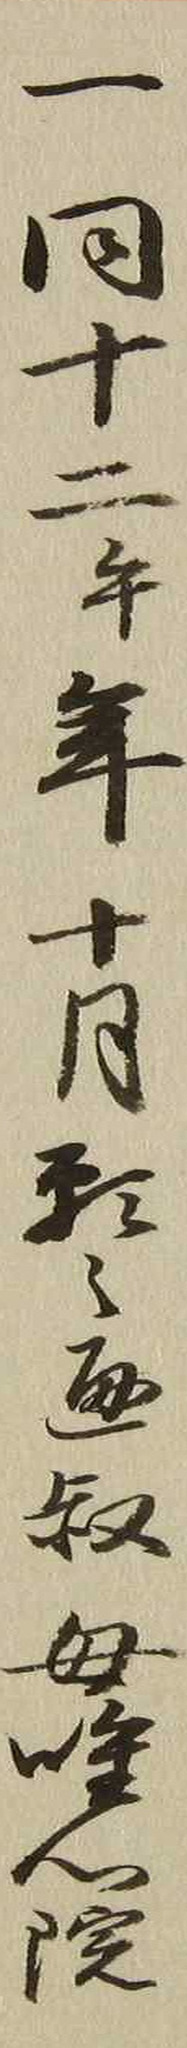一同十二午年十月願之通叔母唯心院
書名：諸士系譜　巻之61　と之部4
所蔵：会津若松市立会津図書館
